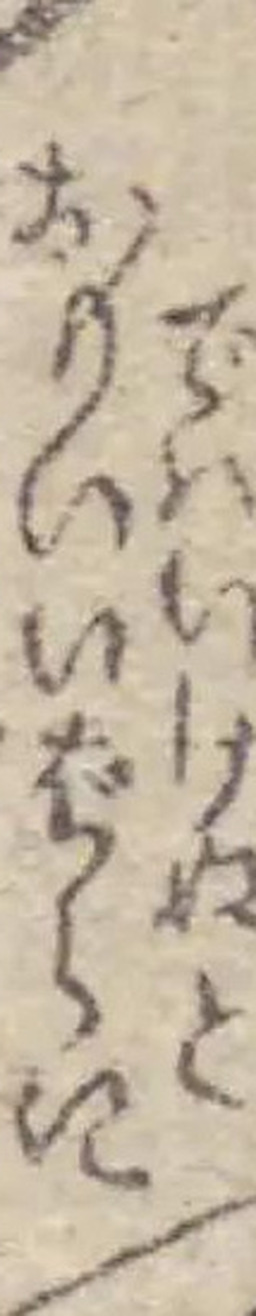おもいいばらき
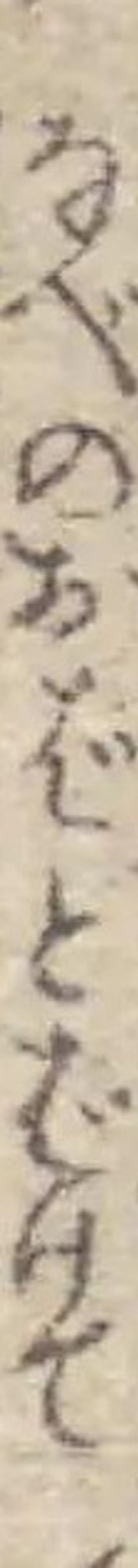なべのおばとばけて
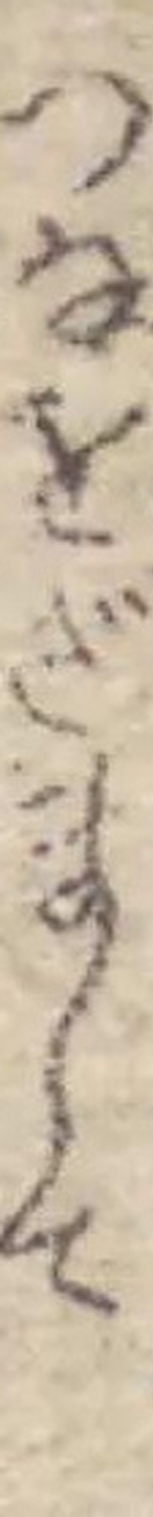つなをだまして
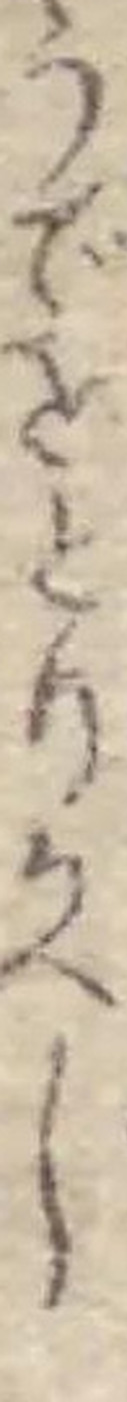うでをとりかへし
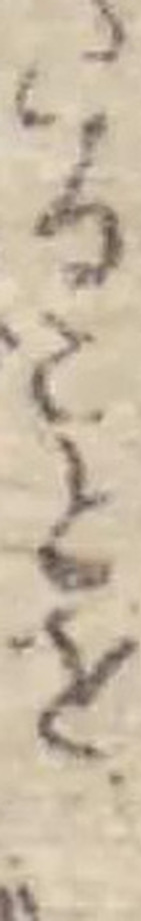たることを
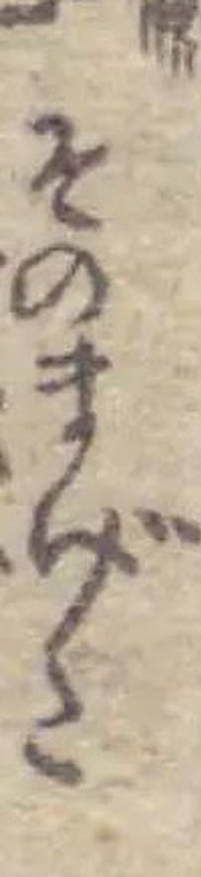そのまげた
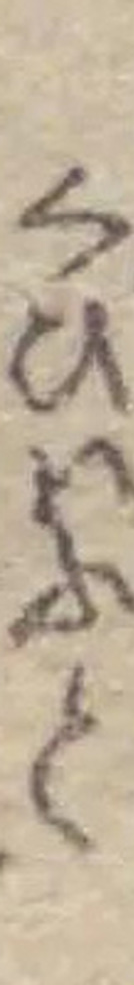くひはふと
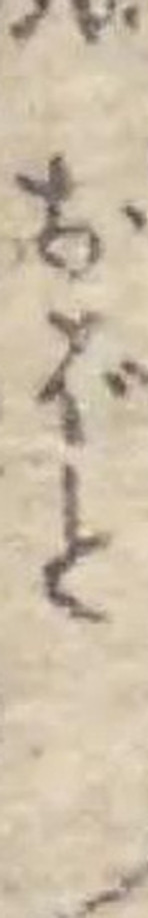おばと
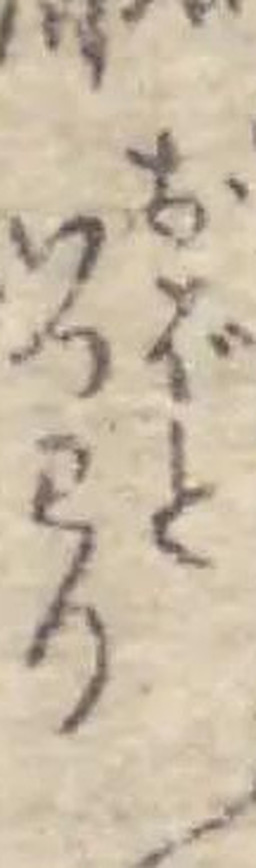いつわり
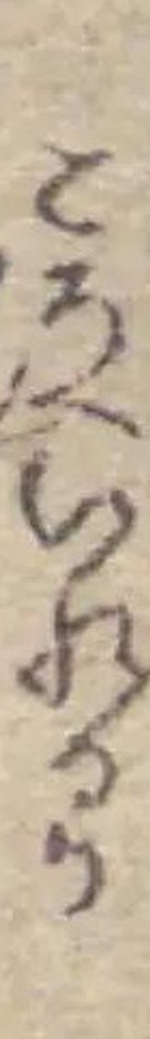ころへいれるか
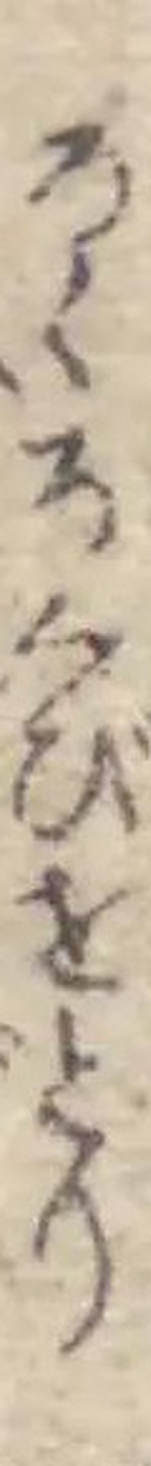ろくろくびをとり
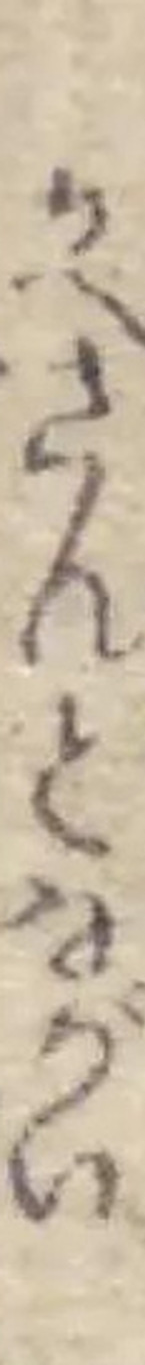かへさんとながい
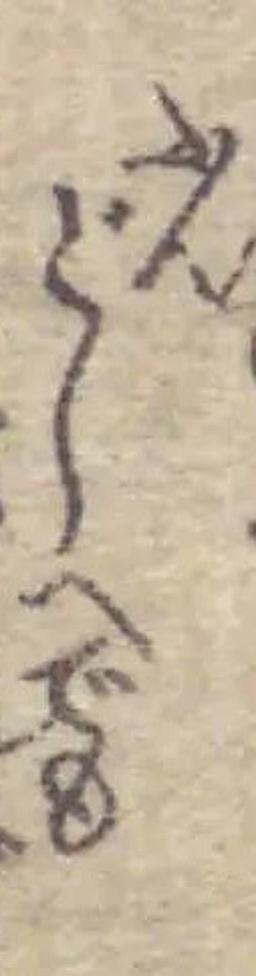どしへでも
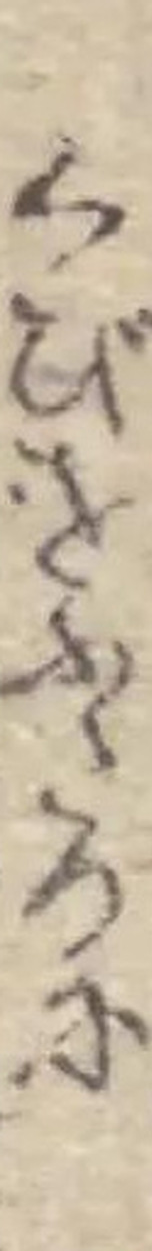くびをふたつに
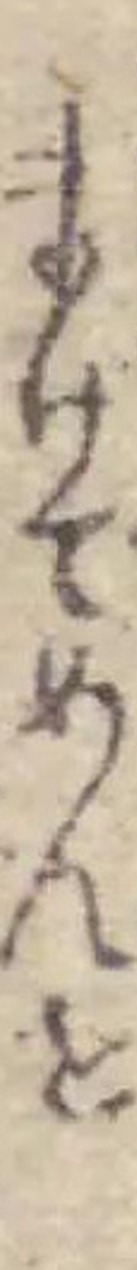まげてめんを
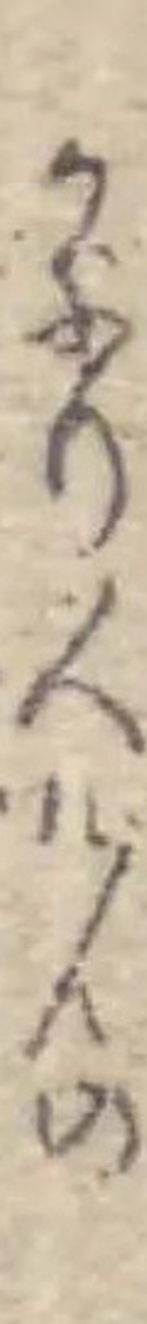かぶり人げんの
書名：化物尽 4巻
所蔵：国立国会図書館 National Diet Library, JAPAN
